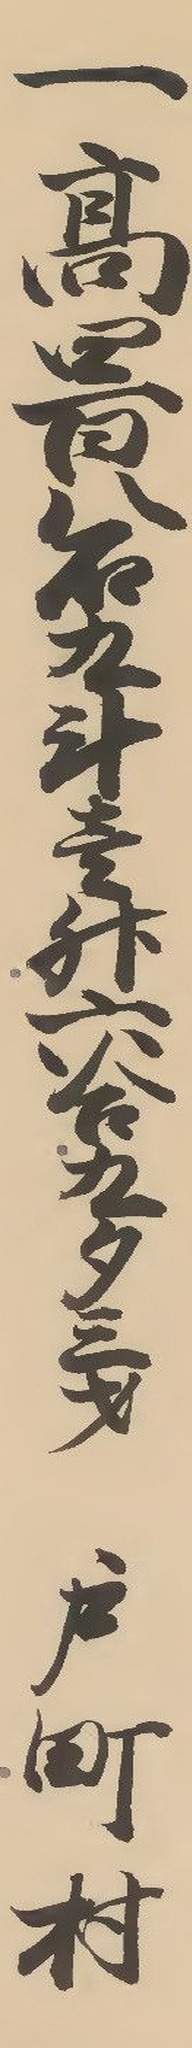一髙四百八石九斗壱升六合九夕三才戸町村
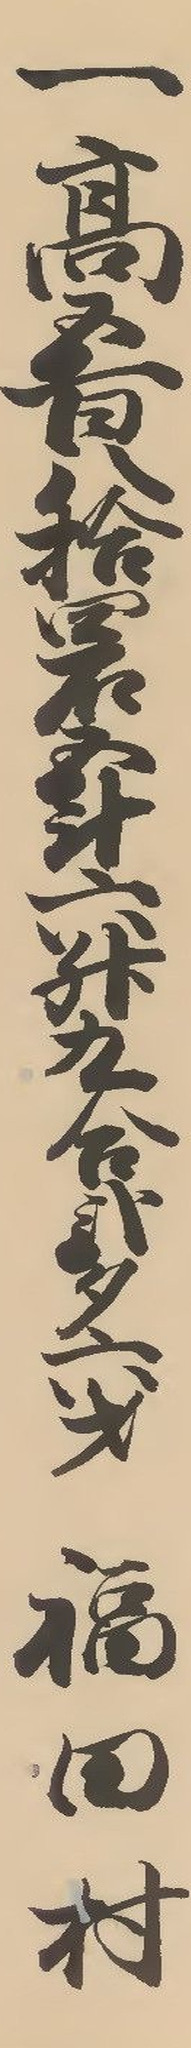一髙五百八拾四石五斗六升九合弐夕六才
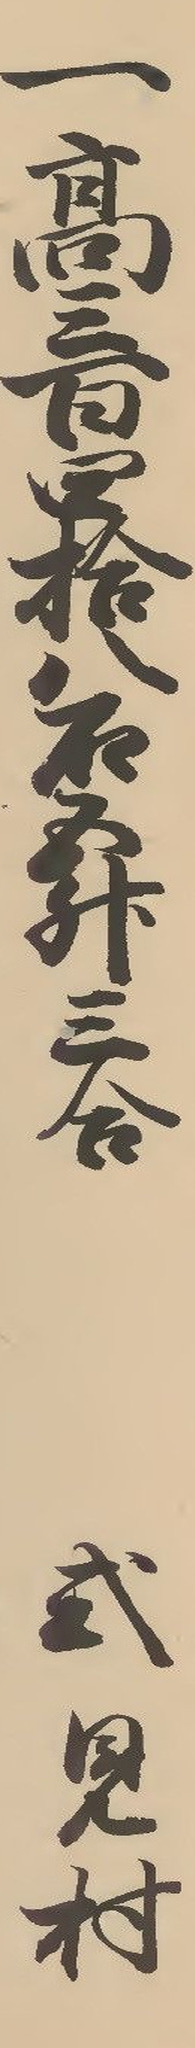一髙三百四拾八石五升三合式見村
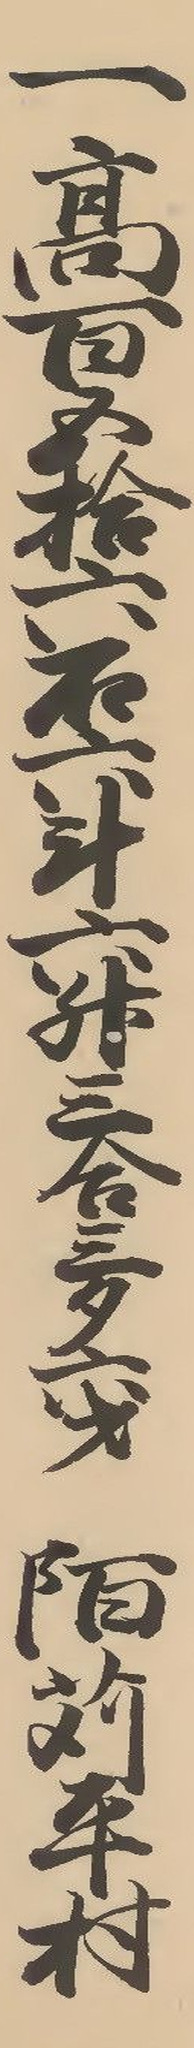一髙百五拾六石六斗六升三合三夕六才
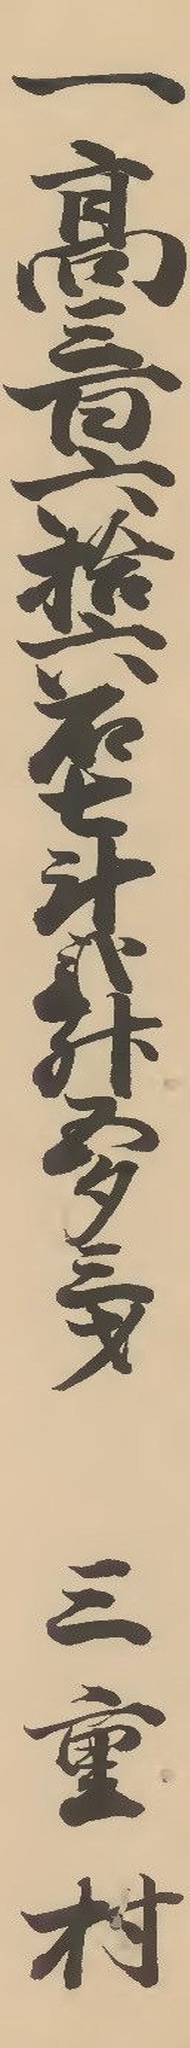一髙三百六拾六石七斗弐升五夕三才三重村
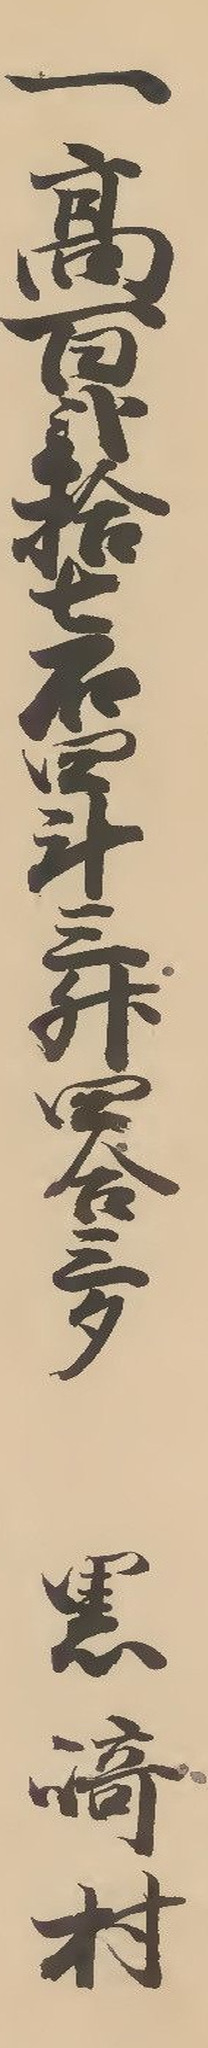一髙百弐拾七石四斗三升四合三夕黑崎村

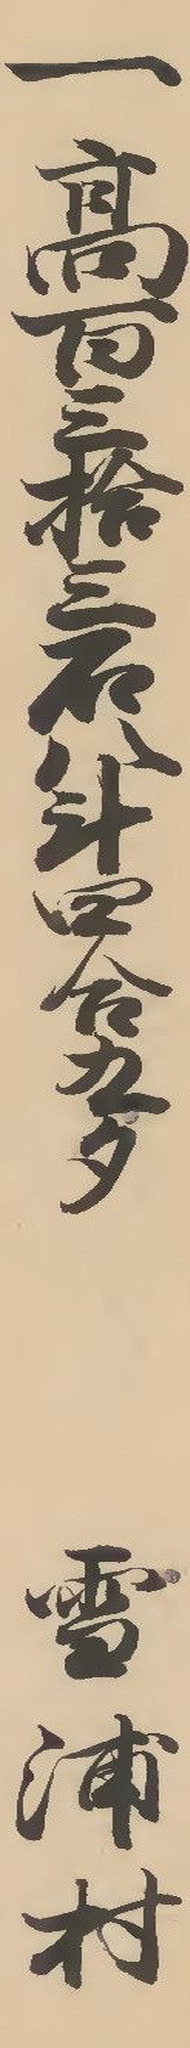一髙百三拾三石八斗四合九夕雪浦村
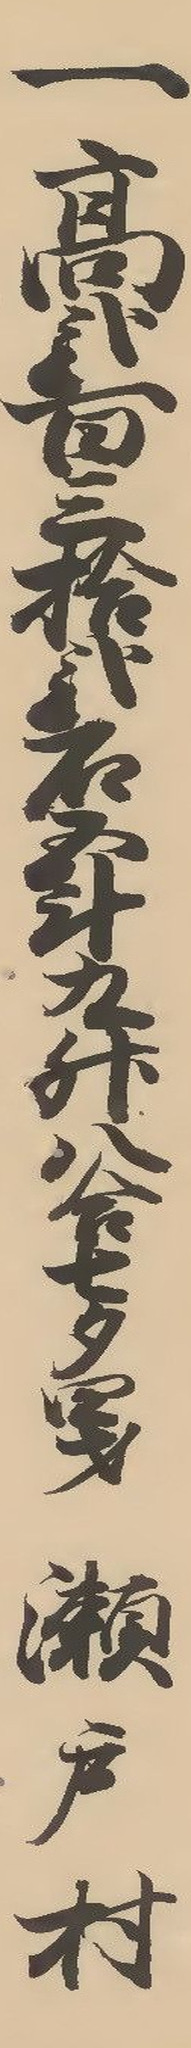一髙弐百三拾弐石五斗九升八合七夕四才
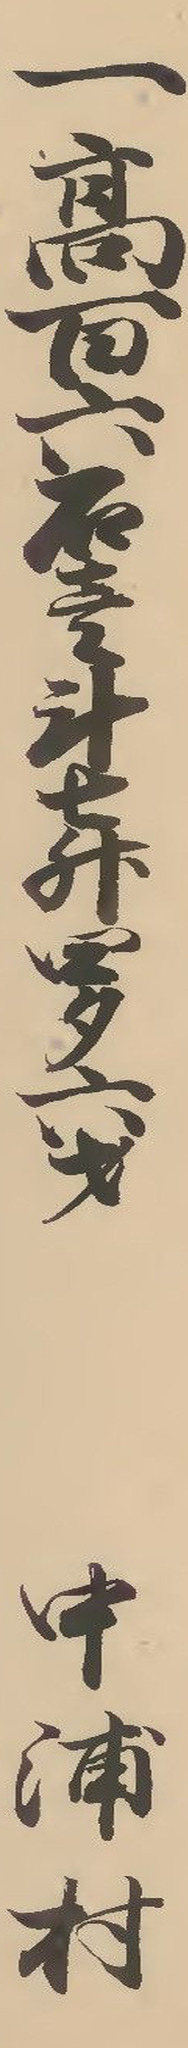一髙百六石壱斗七升四夕六才中浦村
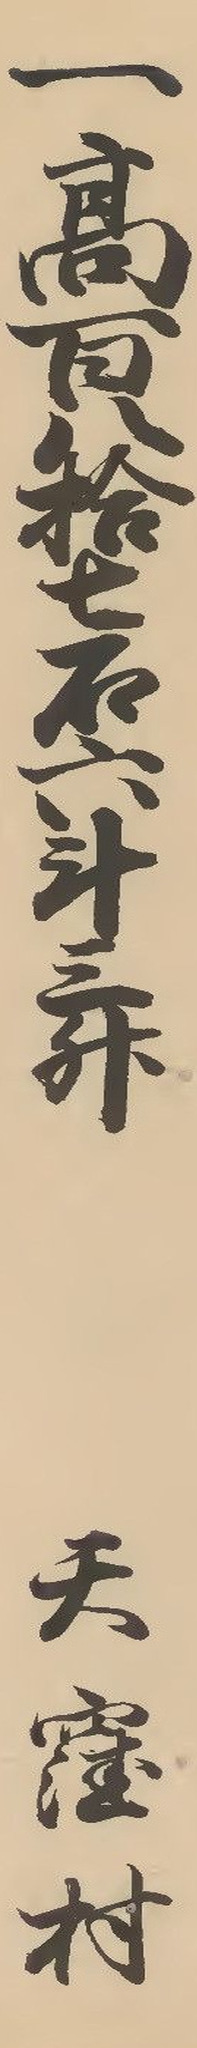一髙百八拾七石六斗三升天窪村
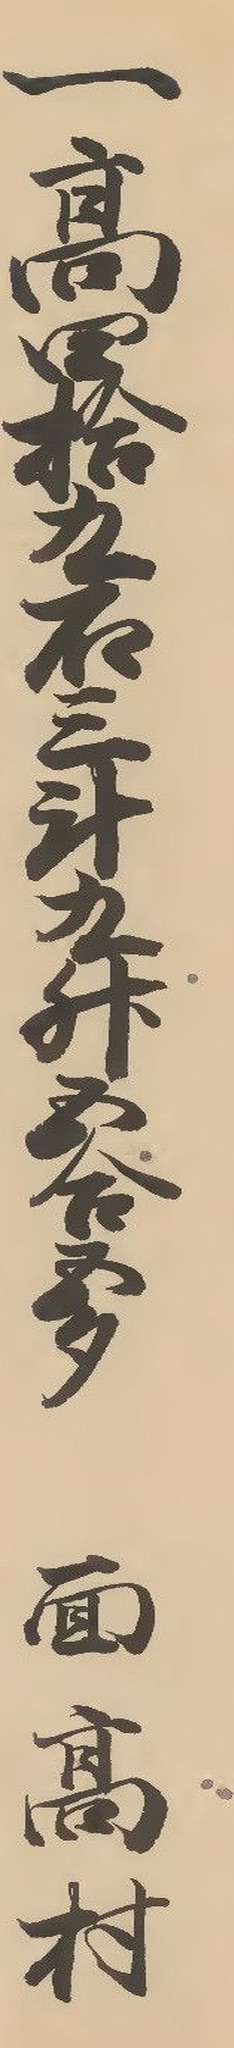一髙四拾九石三斗九升五合五夕面髙村
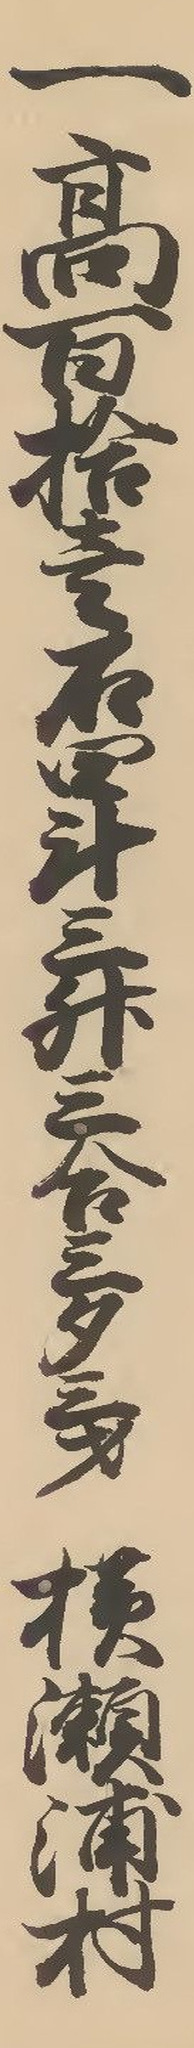一髙百拾壱石四斗三升三合三夕三才横瀬浦村

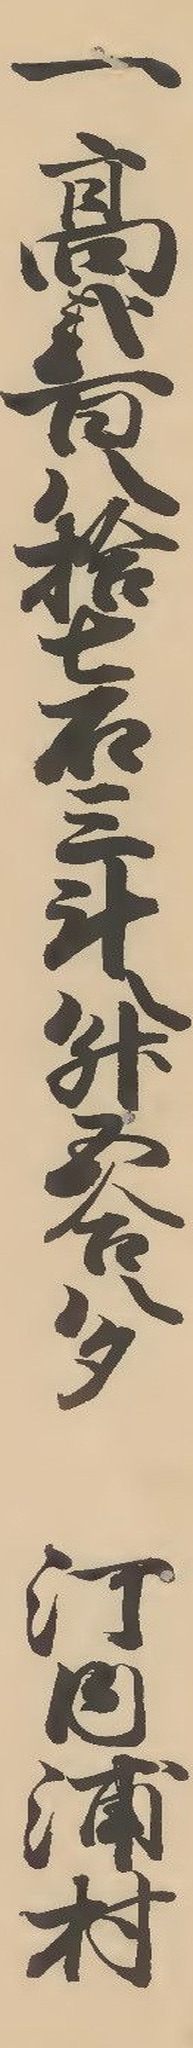一髙弐百八拾七石三斗八升五合八夕河内浦村
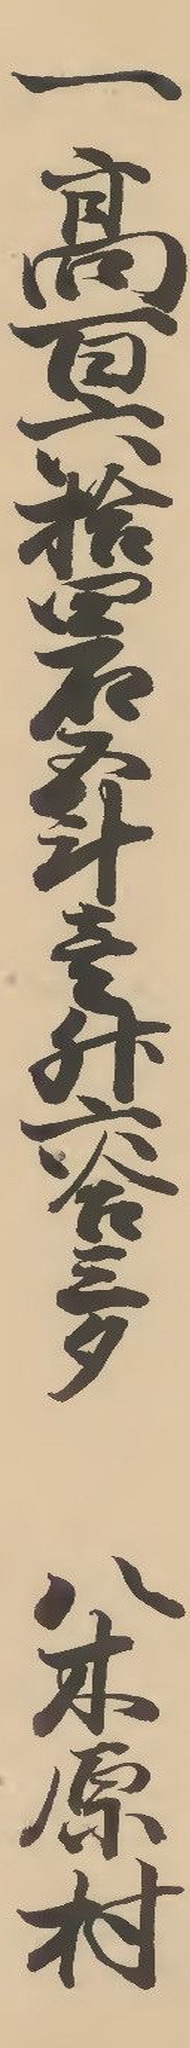一髙百六拾四石五斗壱升六合三夕八木原村
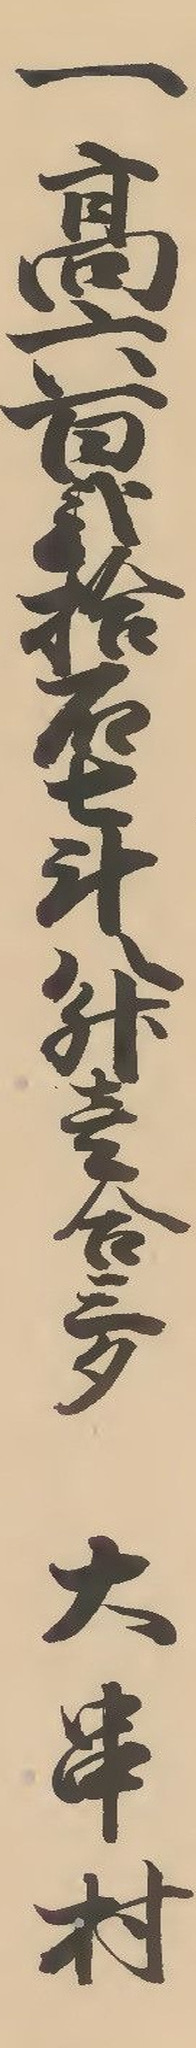一髙六百弐拾石七斗八升壱合三夕大串村
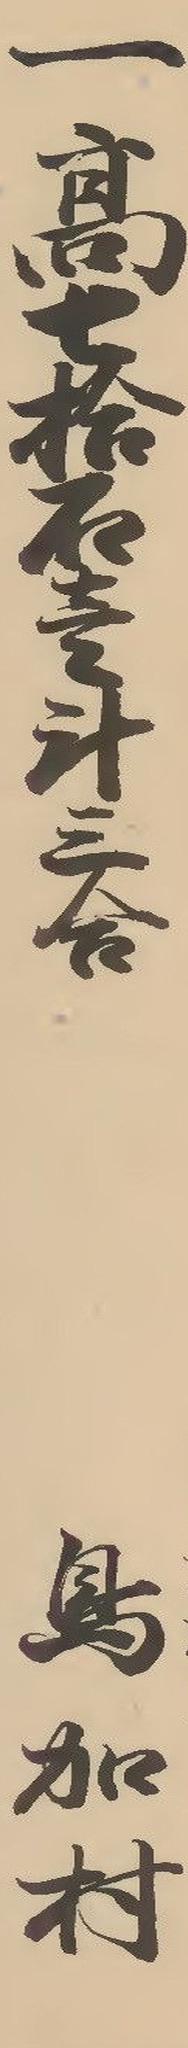一髙七拾石壱斗三合鳥加村
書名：肥前国郷帳
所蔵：国立公文書館 National Archives of Japan
